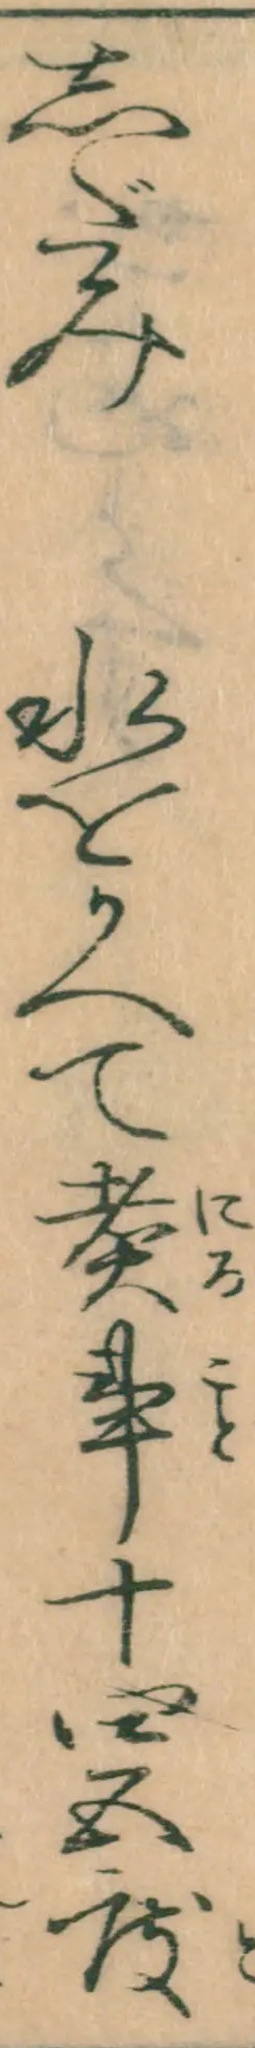しだみ水をかへて煮事十四五度
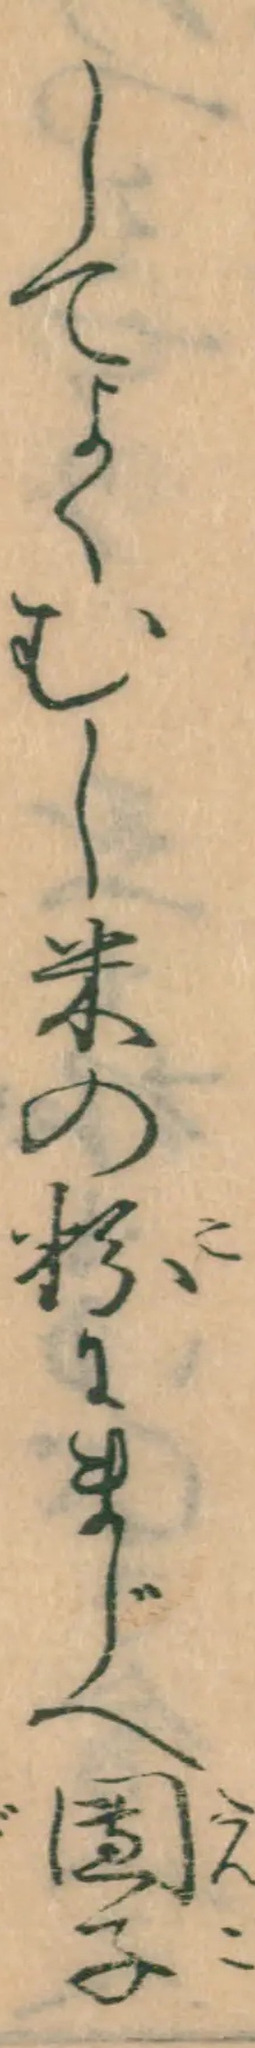してよくむし米の粉にまじへ団子
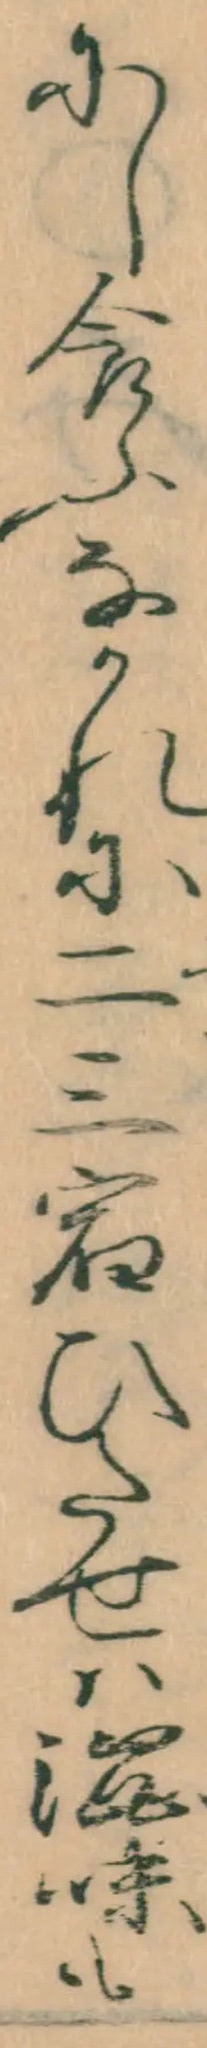にし食ふなかれに二三宿ひたせは渋味も
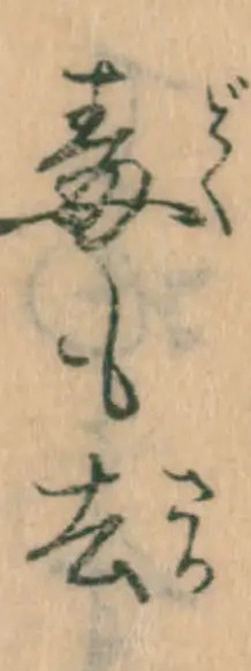毒も去
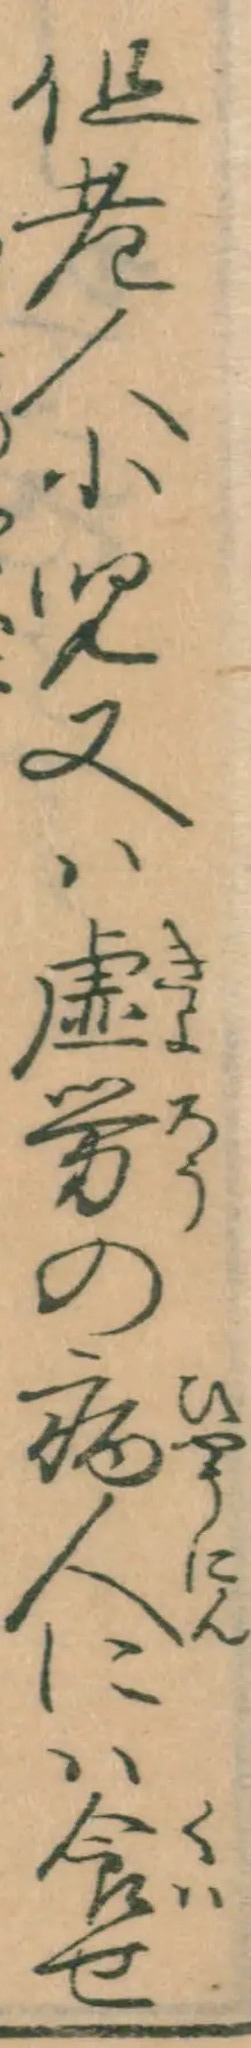但老人小児又は虚労の病人には食せ
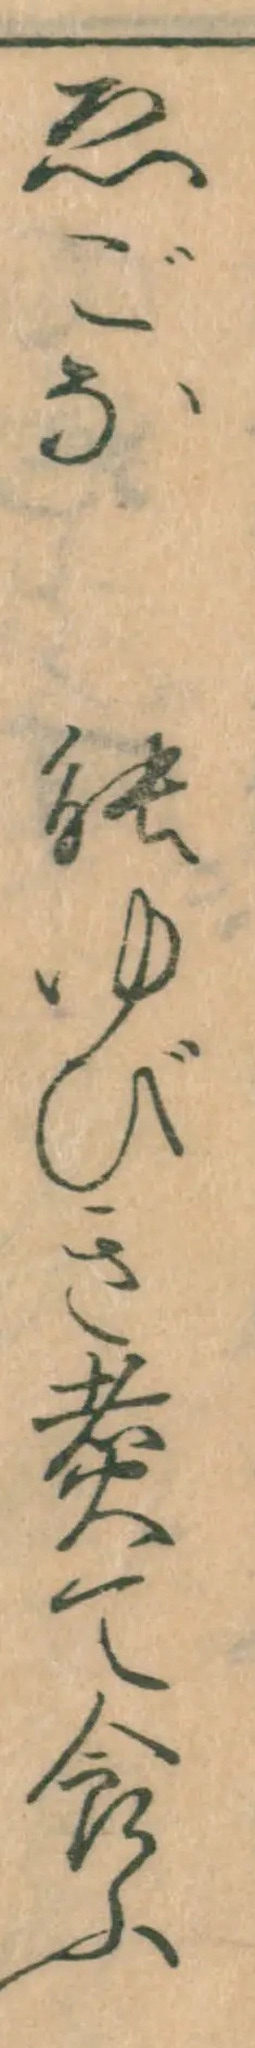ゑごな能ゆびき煮て食ふ
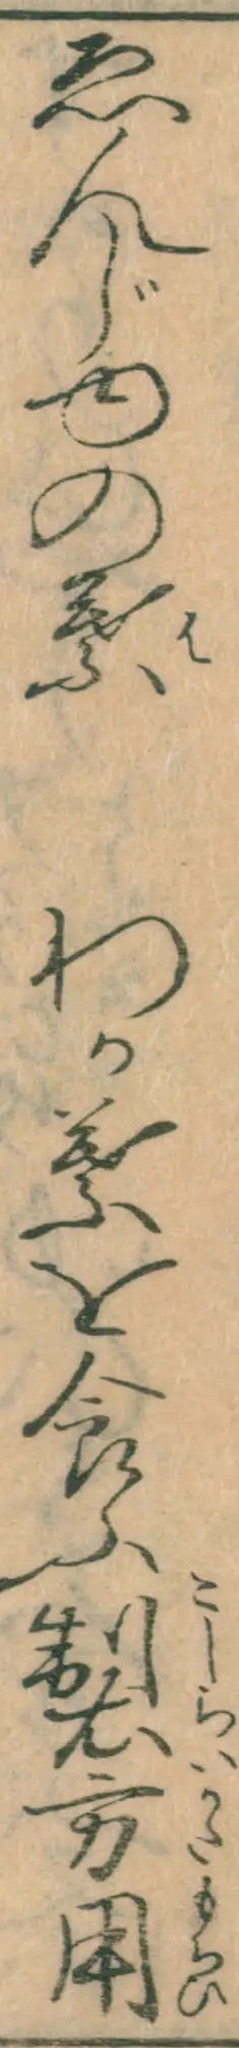ゑんじゆの葉わか葉を食ふ製方用
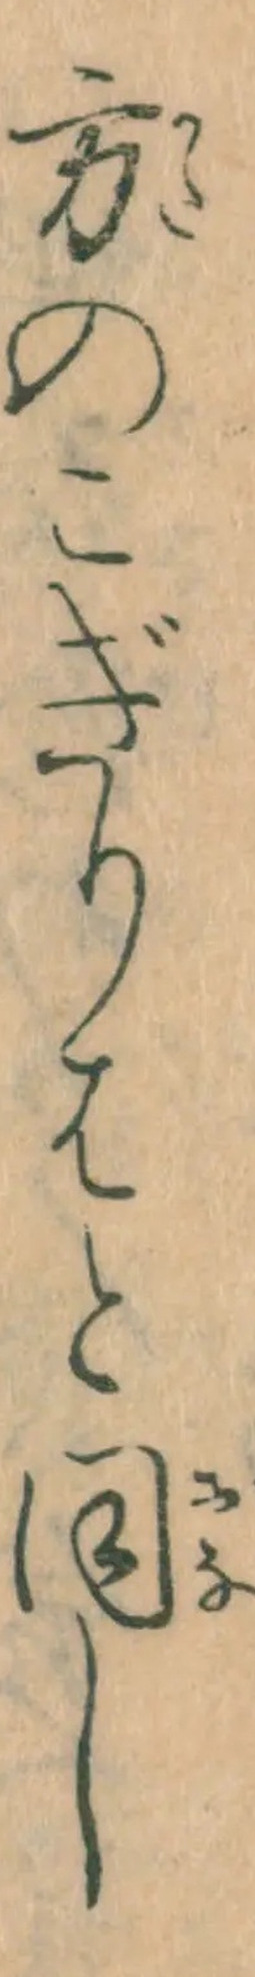方のこぎりはと同し
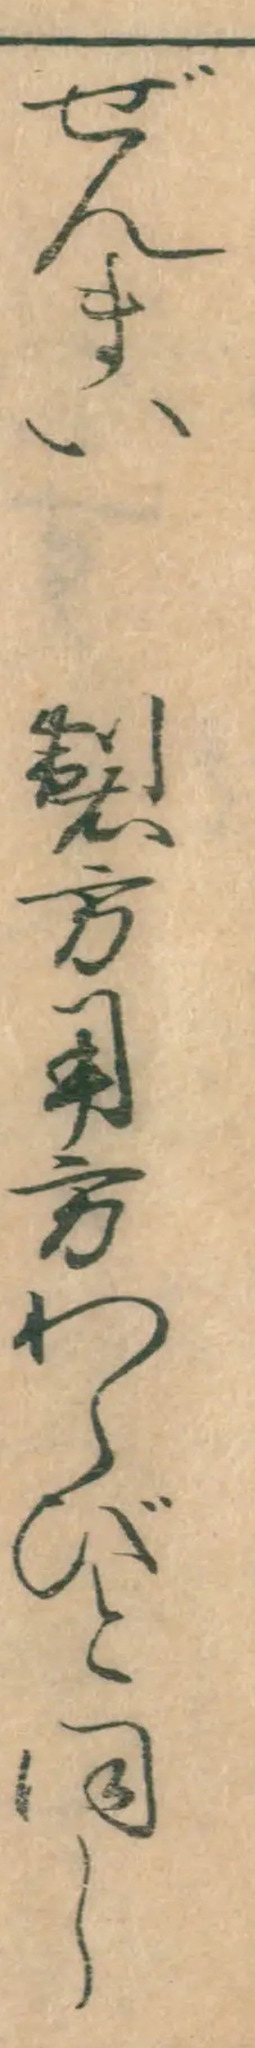ぜんまい製方用方わらびと同し

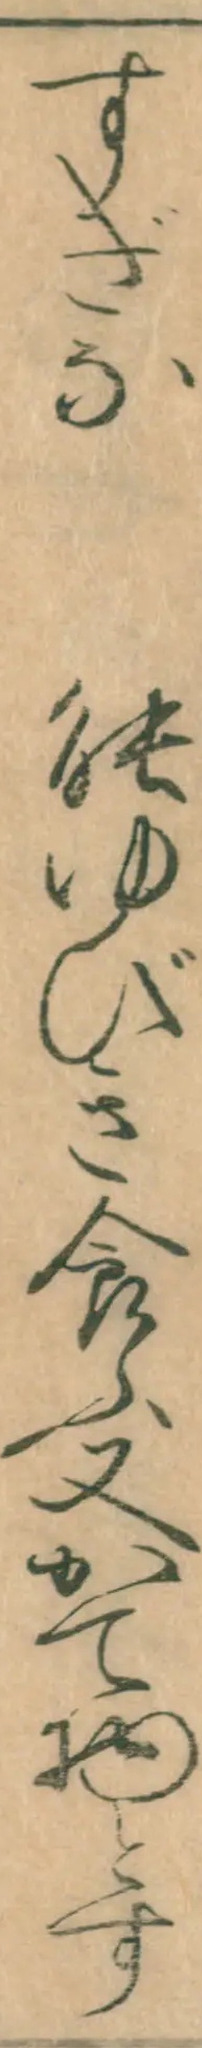すぎな能ゆびき食ふ又かて物とす
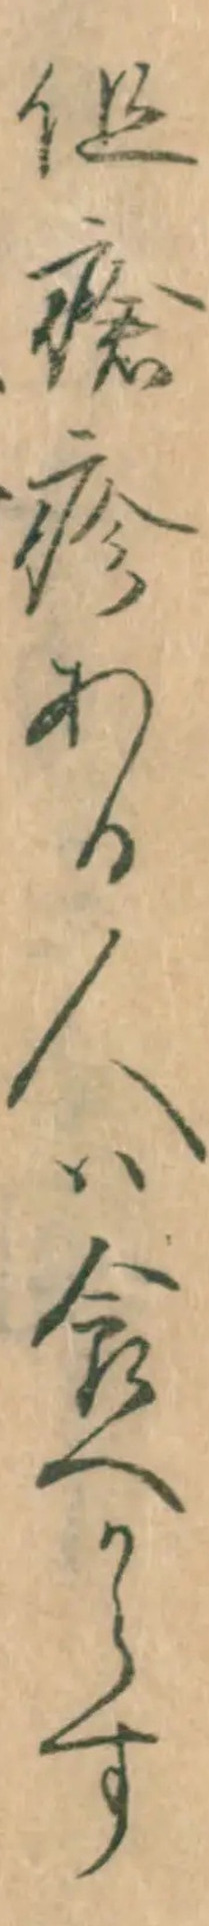但瘡疹ある人は食へからす
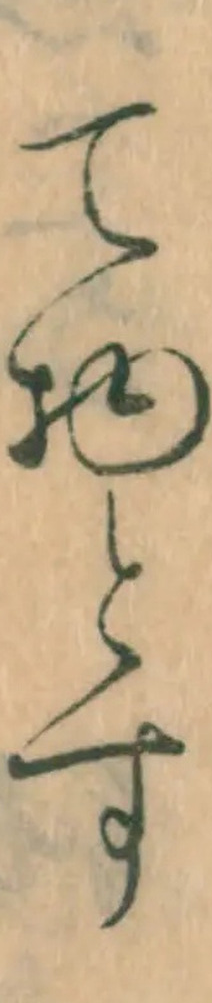て物とす
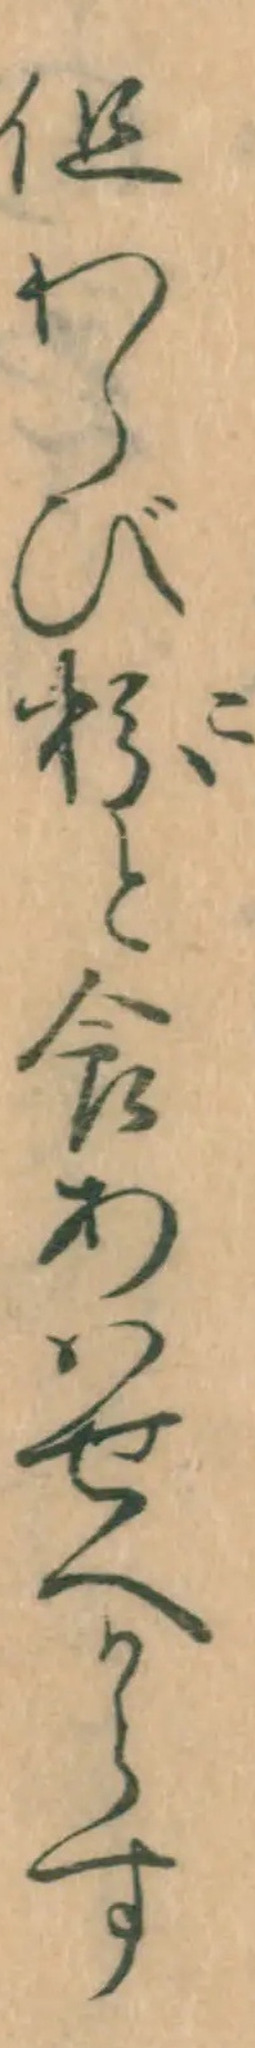但わらび粉と食あはせへからす
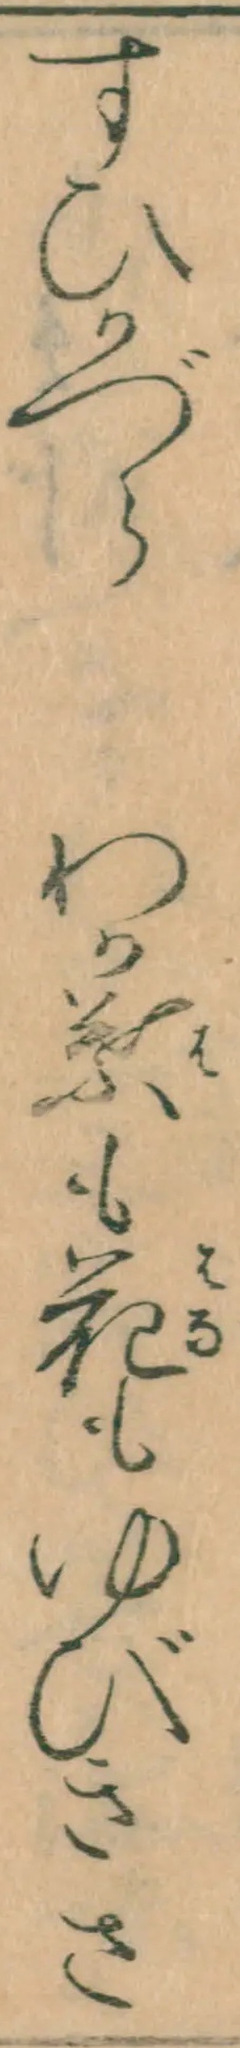すひかづらわか葉も花もゆびきさ
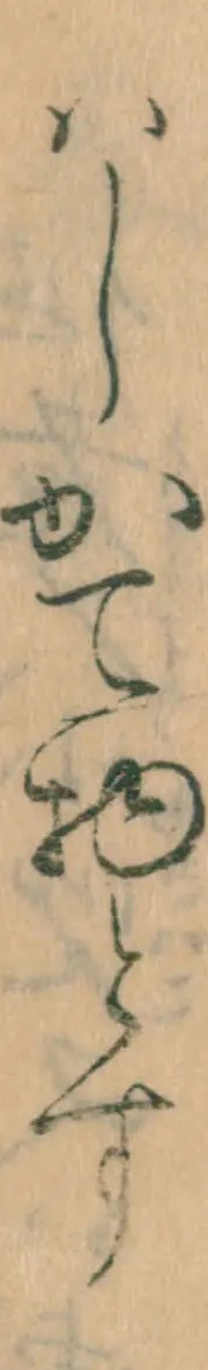はしかて物とす
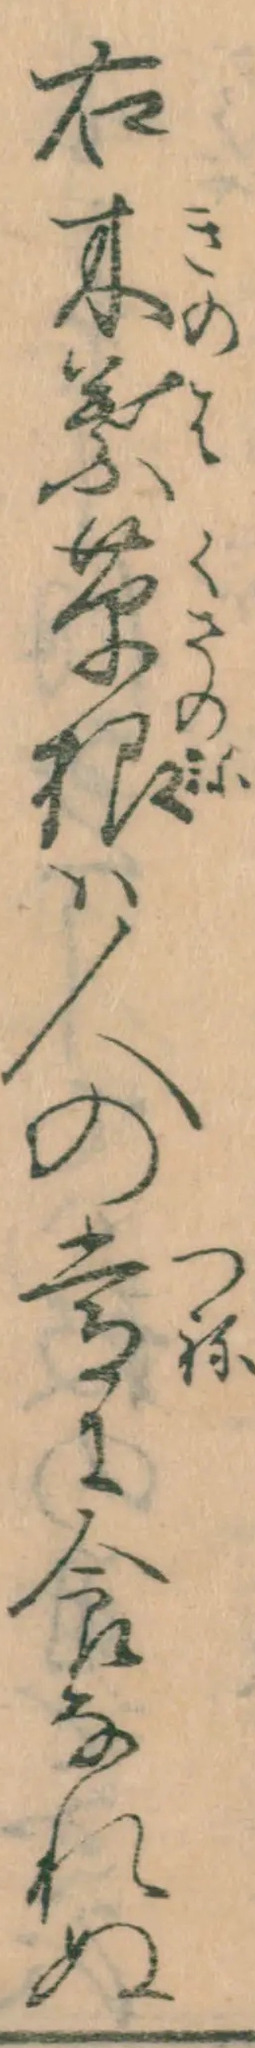右木葉草根は人の常に食なれぬ
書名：かてもの
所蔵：国立国会図書館 National Diet Library, JAPAN
